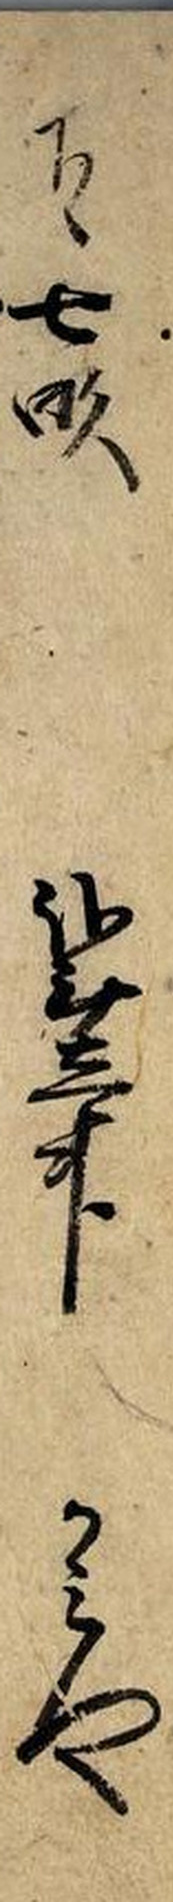下々七畝弐斗壱升かみや
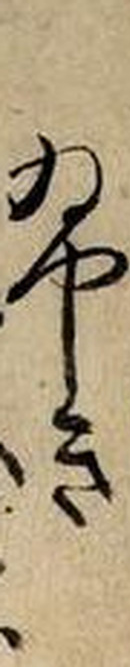ゐやしき
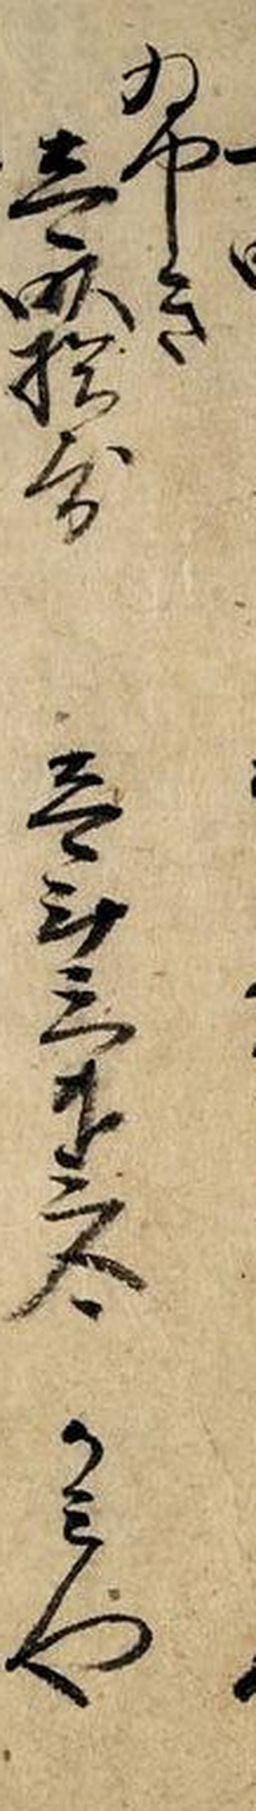壱畝拾歩壱斗三升三合かみや
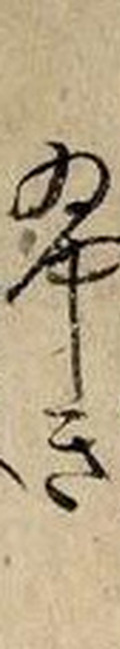ゐやしき
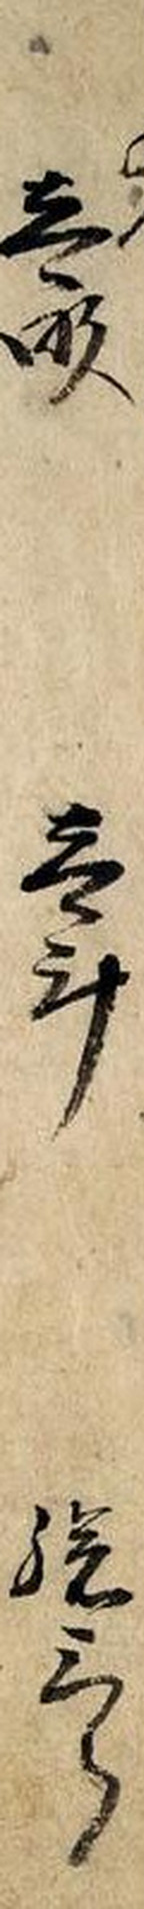壱畝壱斗孫三郎
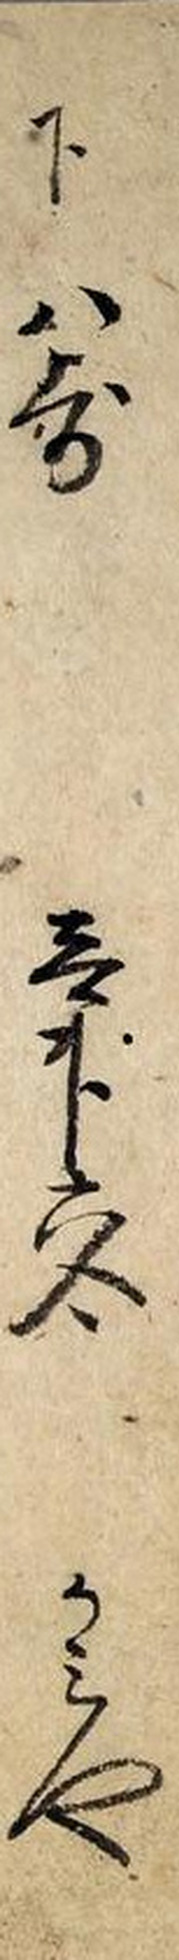下八歩壱升六合かみや
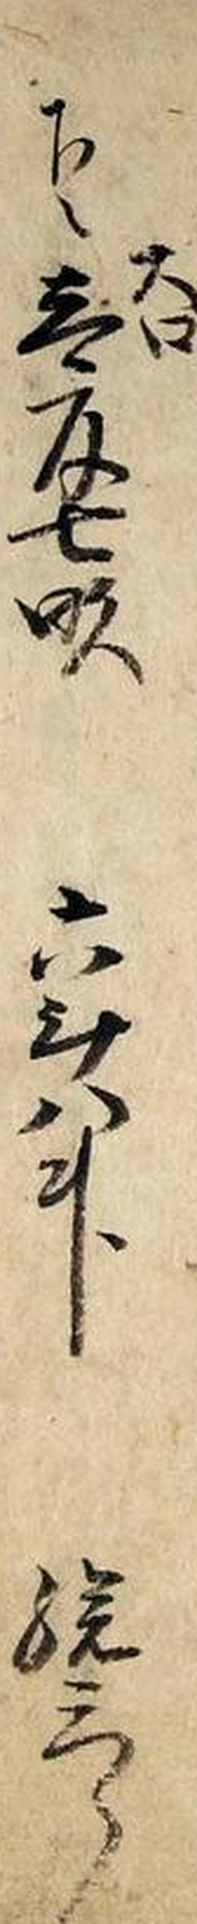下々壱反七畝六斗八升孫三郎
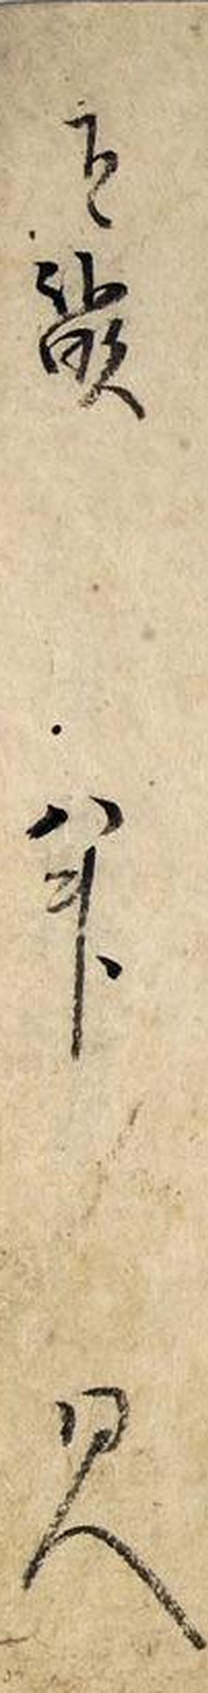下々弐畝八升同人

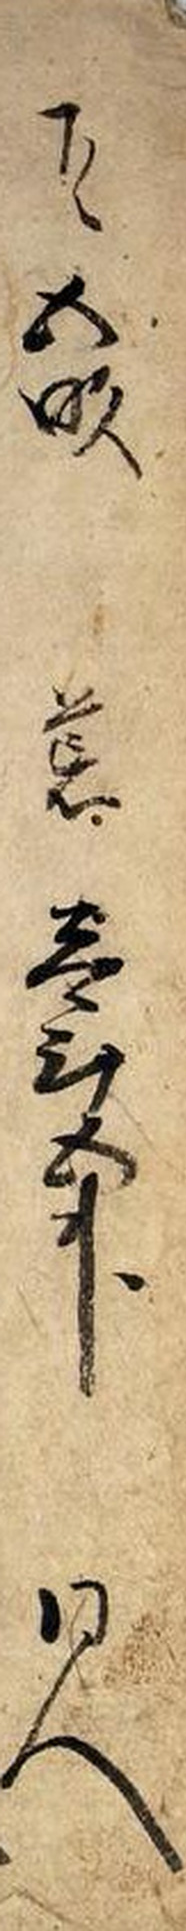下々五畝荒壱斗五升同人
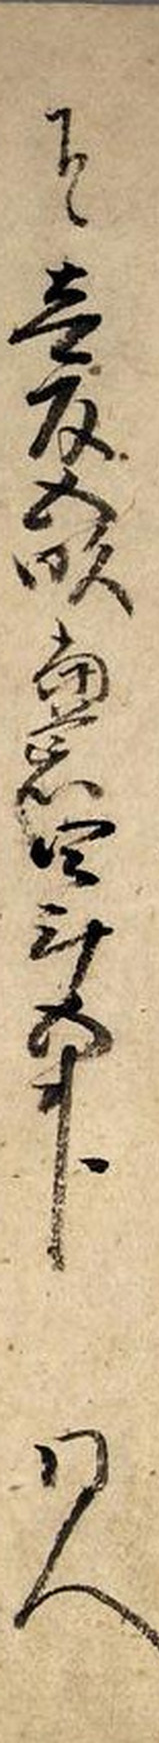下々壱反五畝当荒四斗五升同人
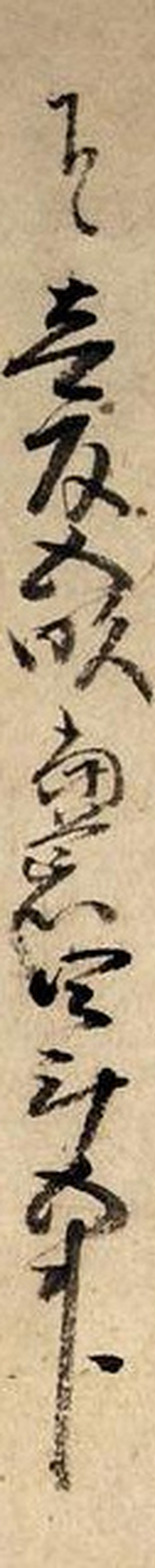下々壱反五畝当荒四斗五升同人
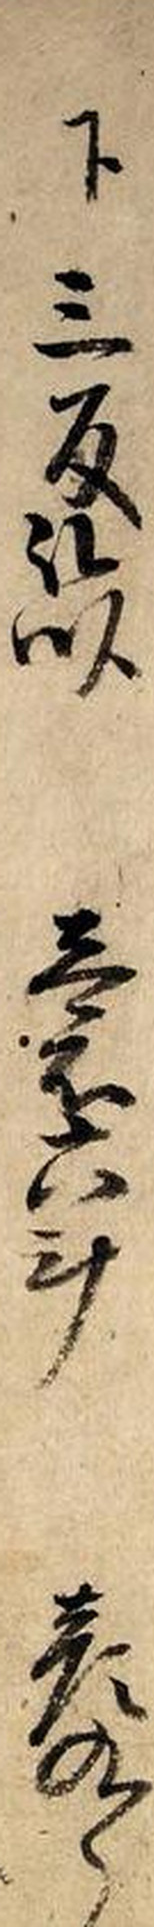下三反弐畝壱石六斗彦九郎
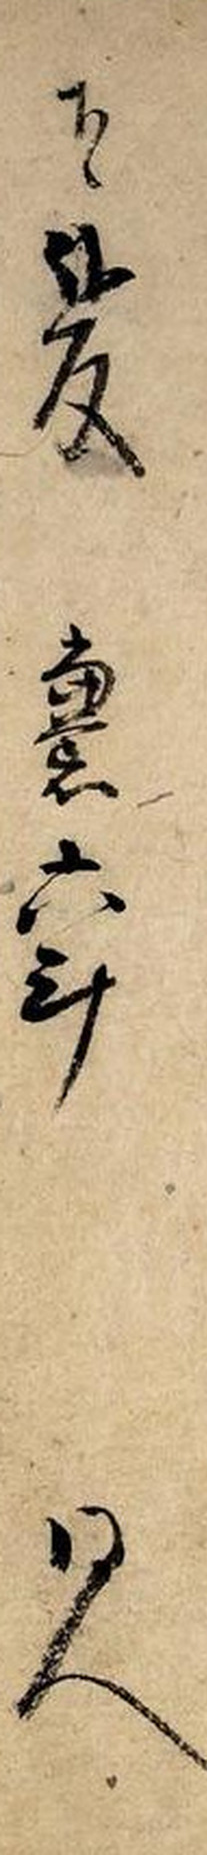下々弐反当荒六斗同人
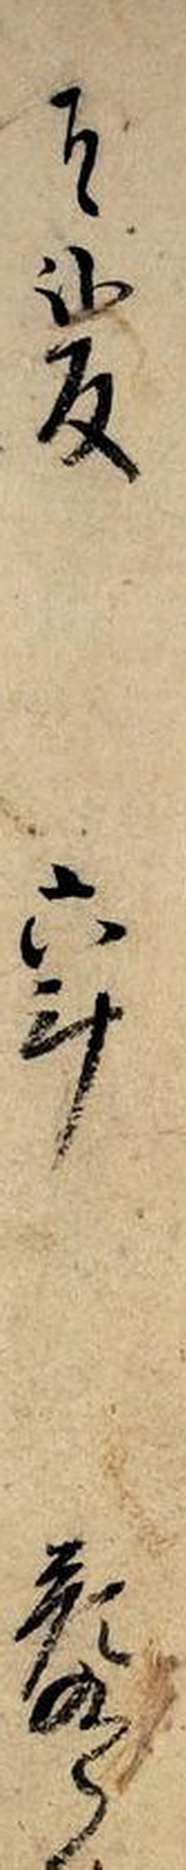下々弐反六斗彦九郎
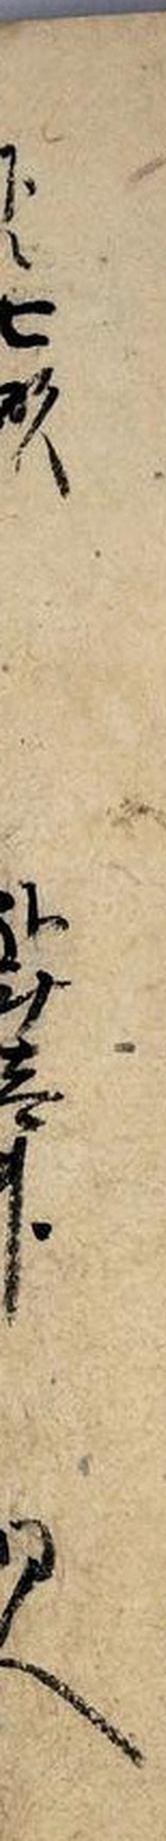下々七畝弐斗壱升同人
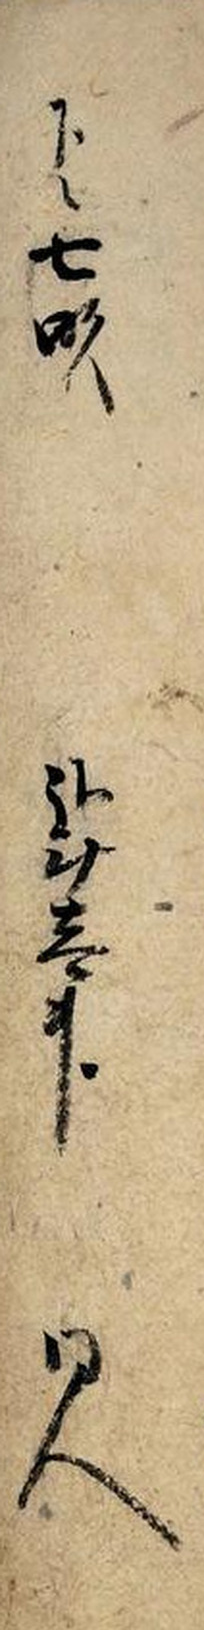下々七畝弐斗壱升同人
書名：若州三方郡之内世久見浦御検地帳（世久見浦検地帳写）
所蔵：福井県文書館 Fukui Prefectural Archives
